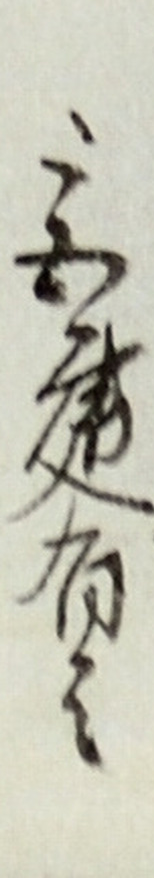宮建有之
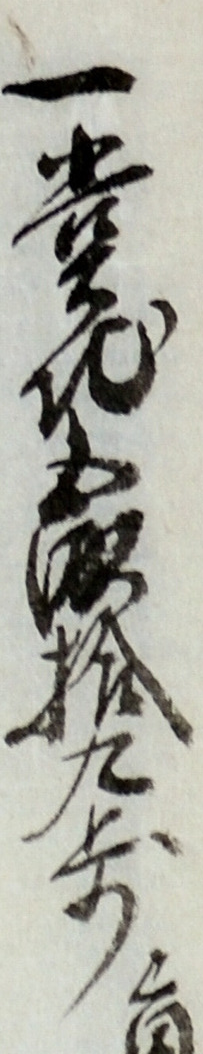一堂地五畝拾九歩薬師
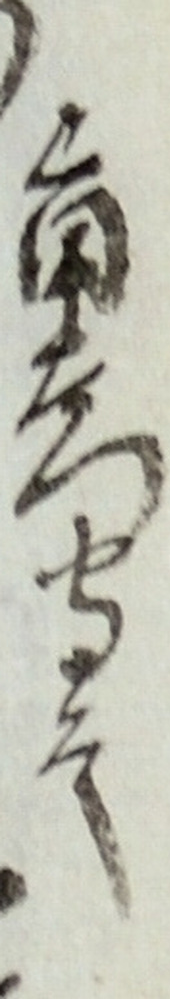曽右衛門守之
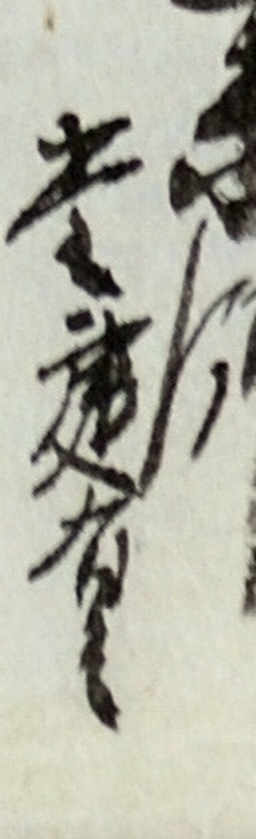堂建有之
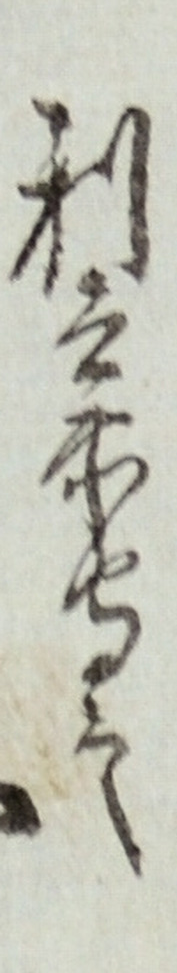利兵衛守之
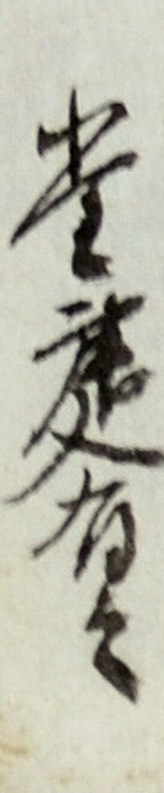堂建有之
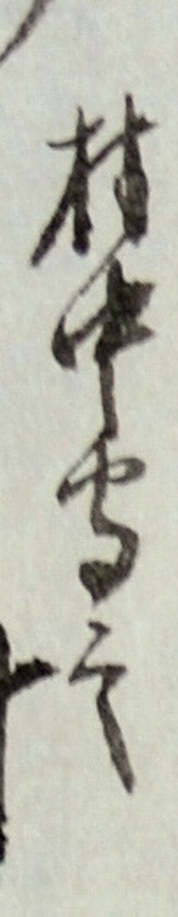村中守之

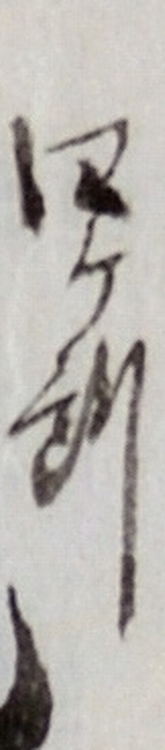四ヶ所
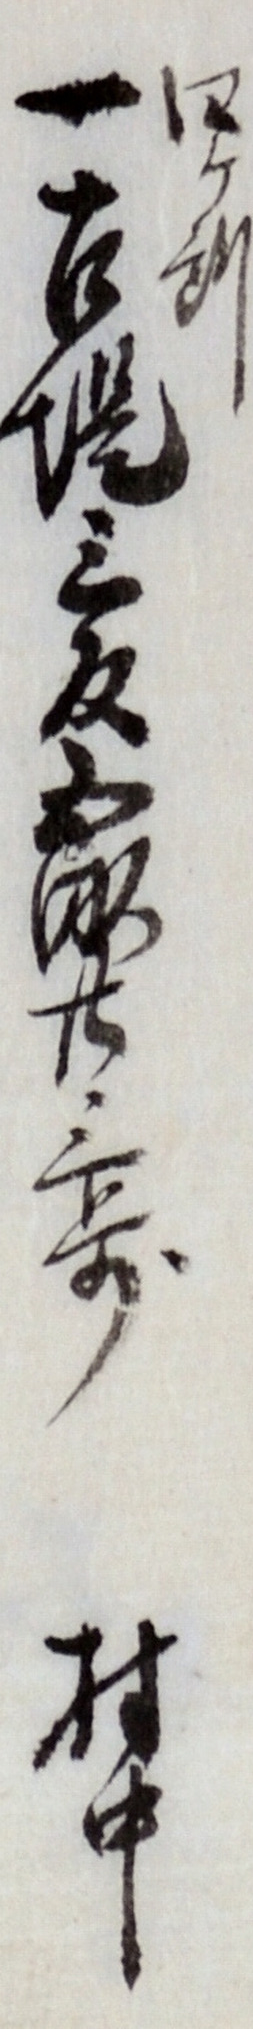一古堤三反五畝廿三歩村中
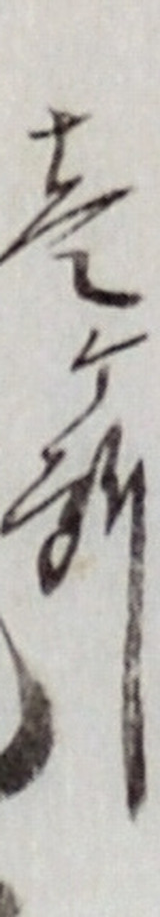壱ヶ所
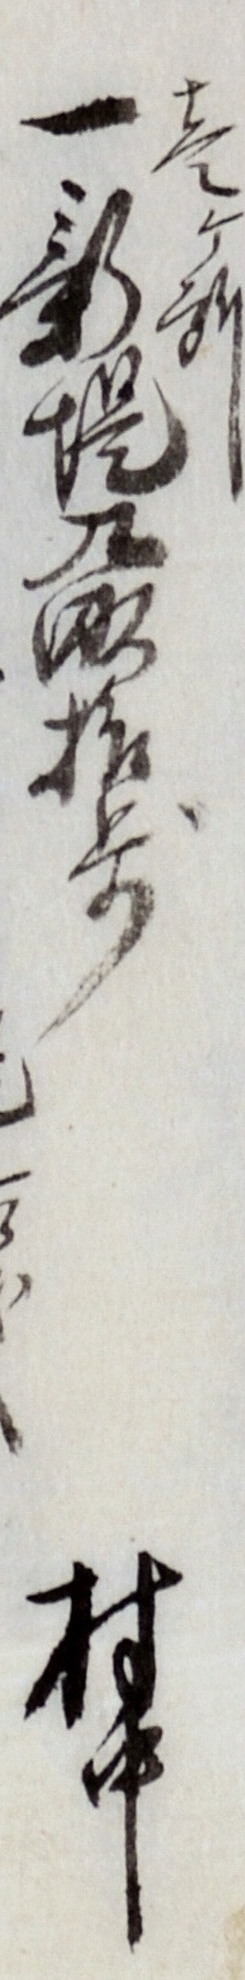一新堤九畝拾歩村中
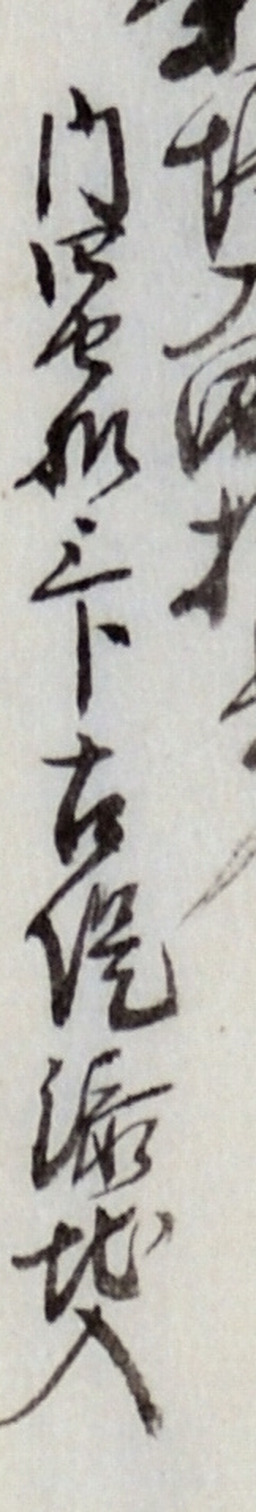内四セ拾三ト古堤添地入
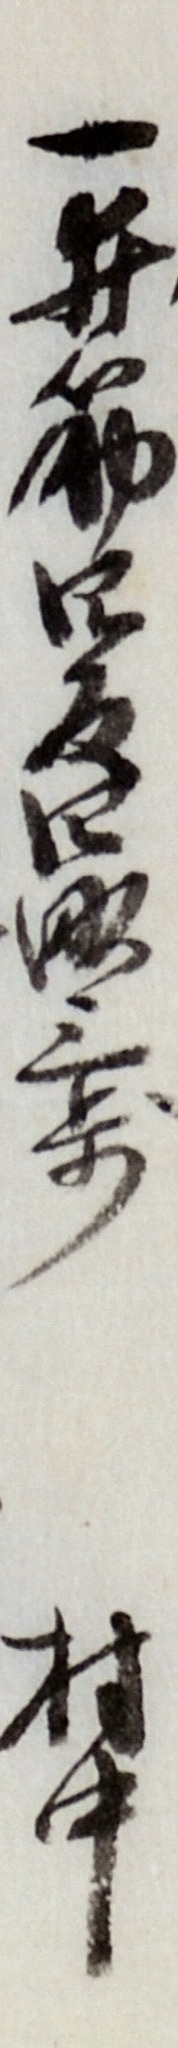一井筋四反四畝三歩村中
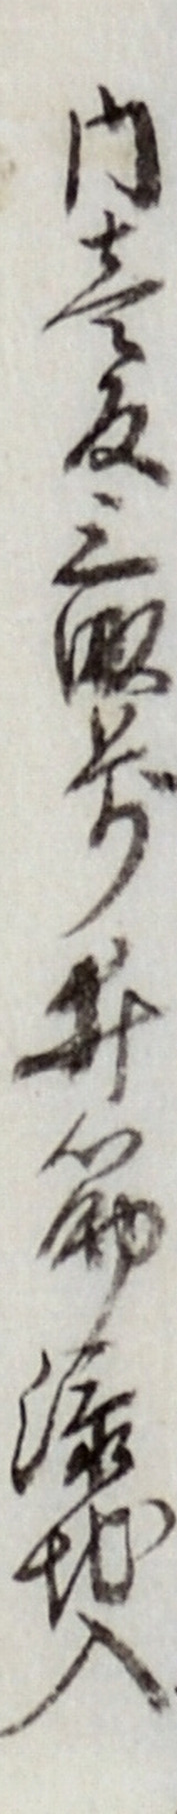内壱反三畝歩井筋添地入
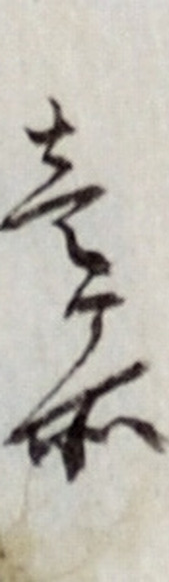壱ヶ所
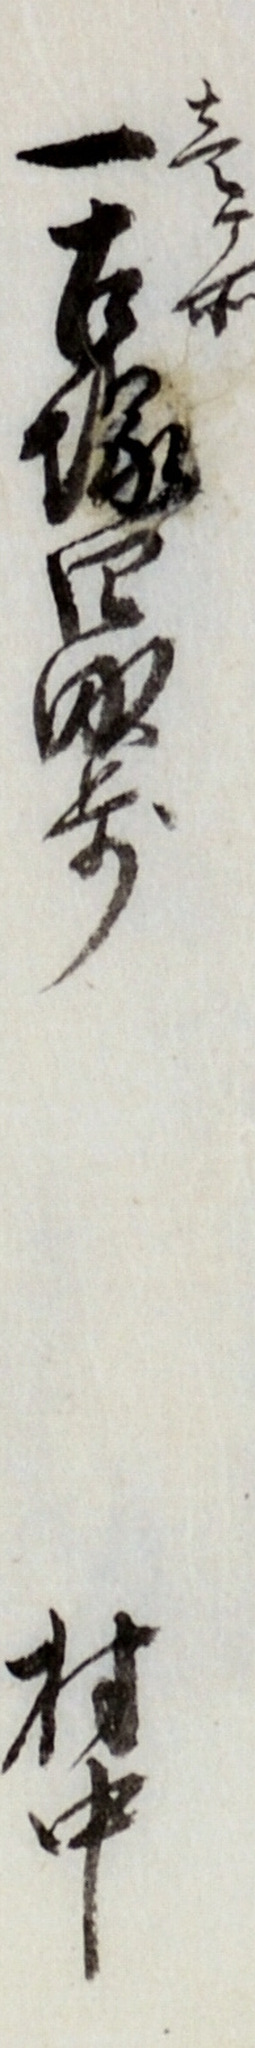一古塚四畝歩村中
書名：御領分中山林社地手控
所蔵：伊那市立高遠町図書館・合同会社AMANE
